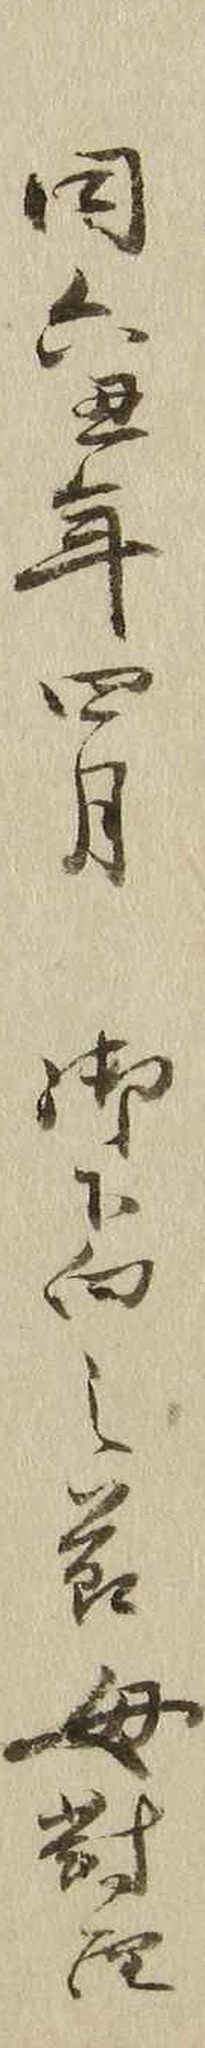一同六丑年四月御下向之節母対面
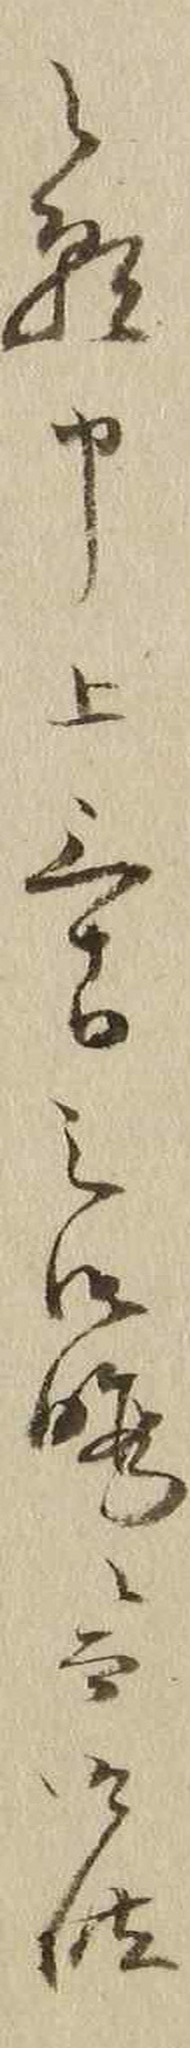之願申上三十日之御暇ニ而御供
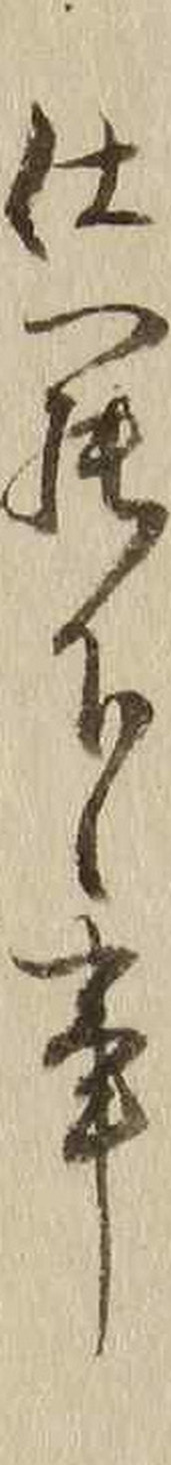仕罷下候事
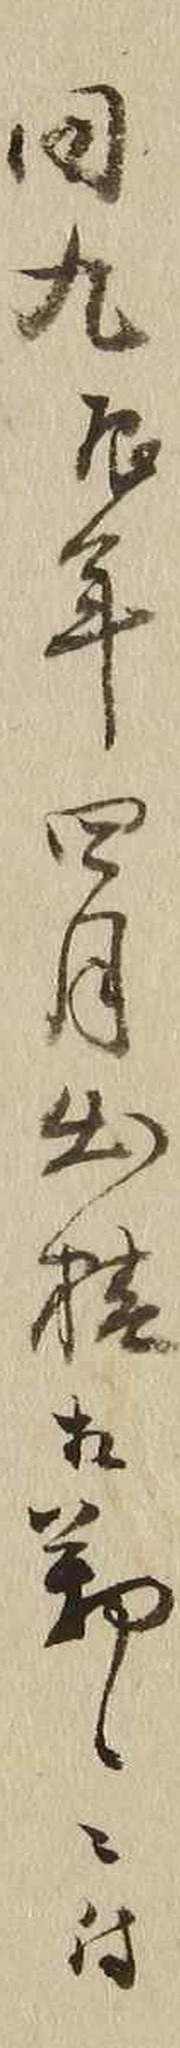一同九辰年四月出精相勤候ニ付
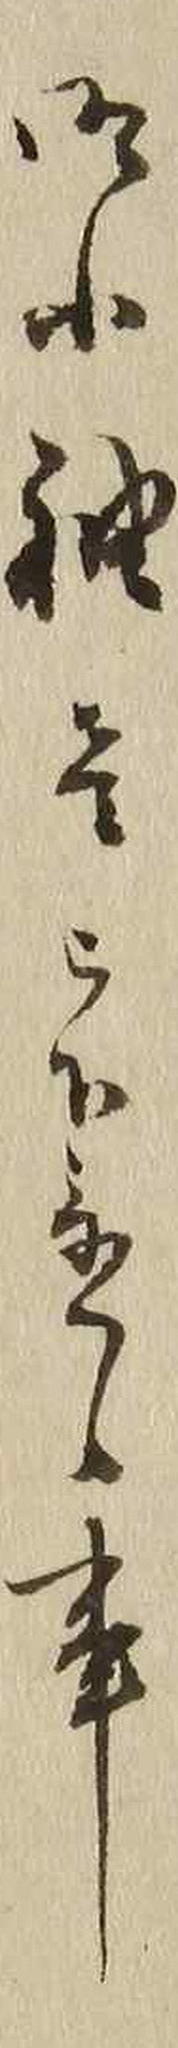御小袖壱被下置候事
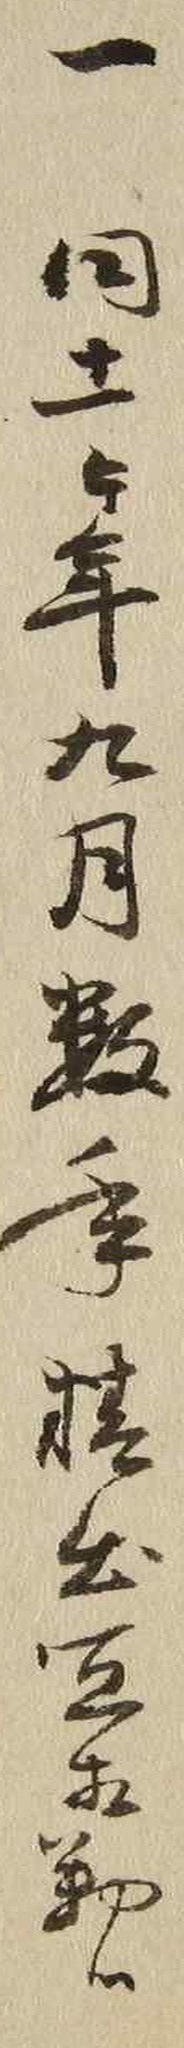一同十一午年九月数年精出宜相勤候
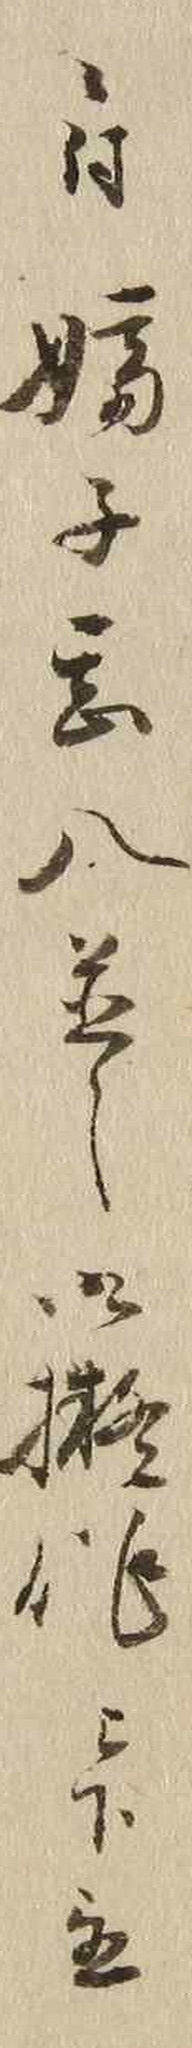ニ付嫡子甚八並之御擬作被下置
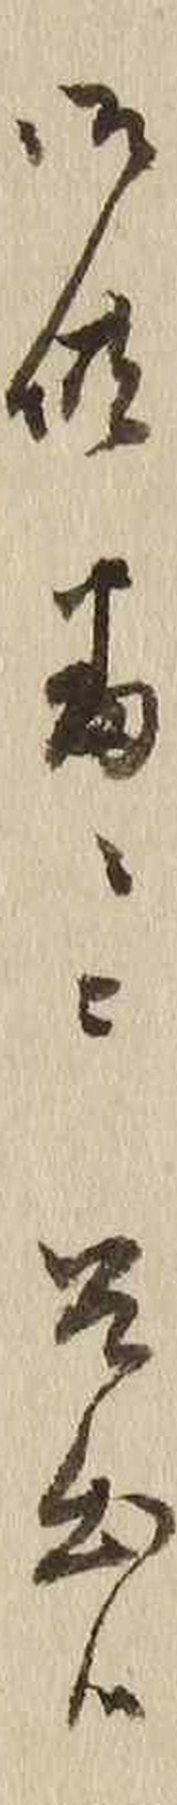御供番ニ被召出候
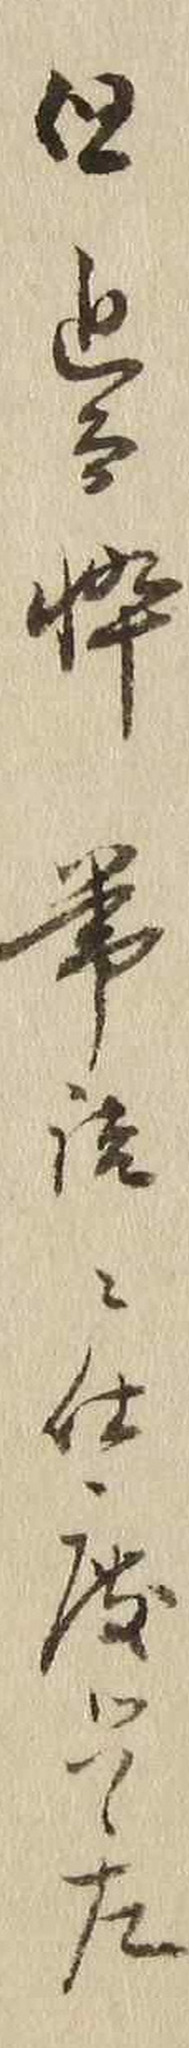但追而忰常詰ニ仕度候ハヽ左
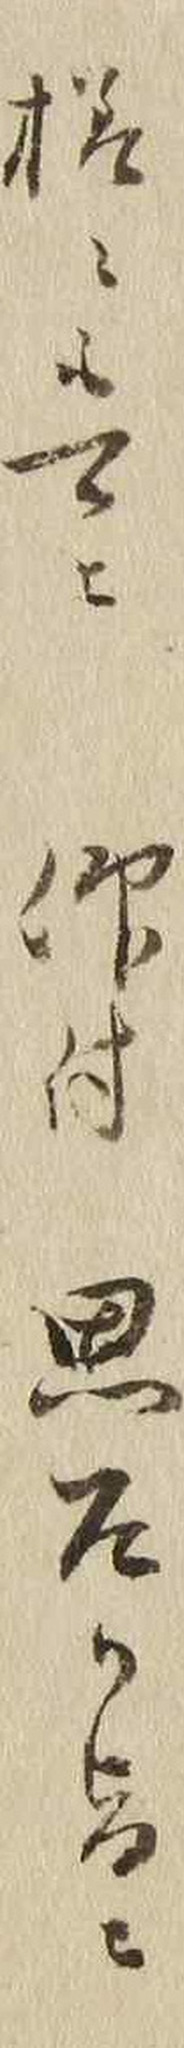様ニも可被仰付思召候旨被
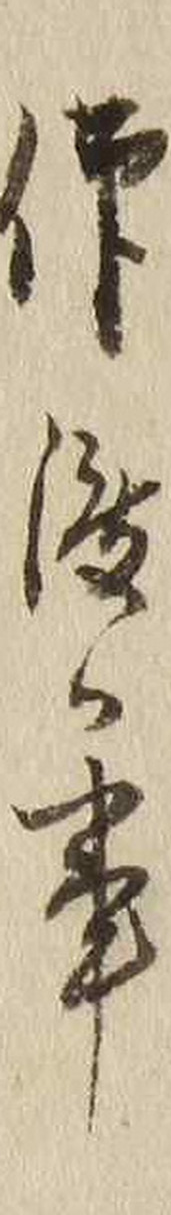仰渡候事
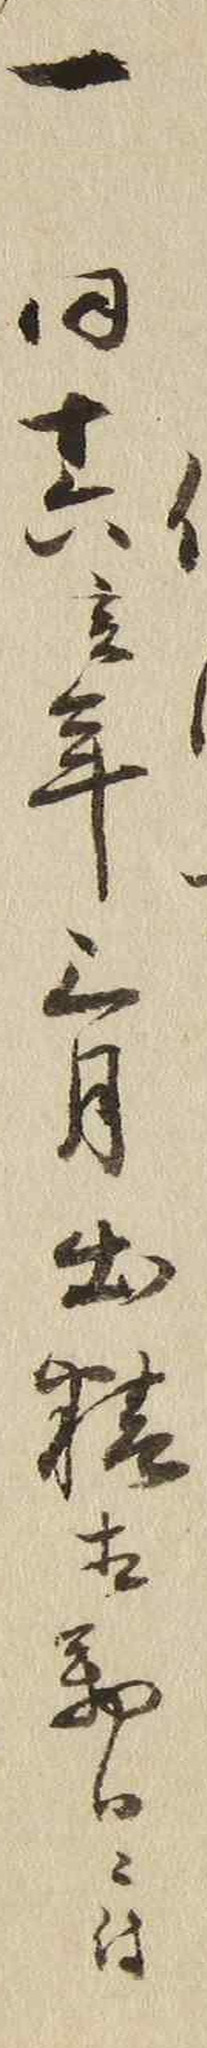一同十六亥年三月出精相勤候ニ付
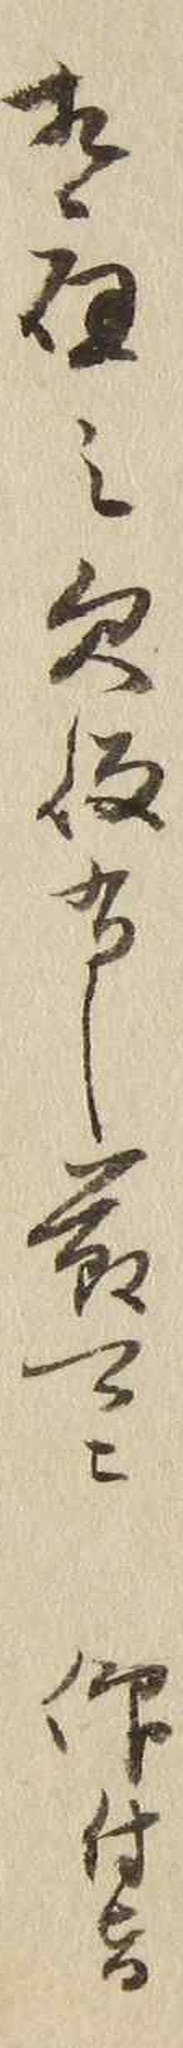相応之欠役有之節可被仰付旨
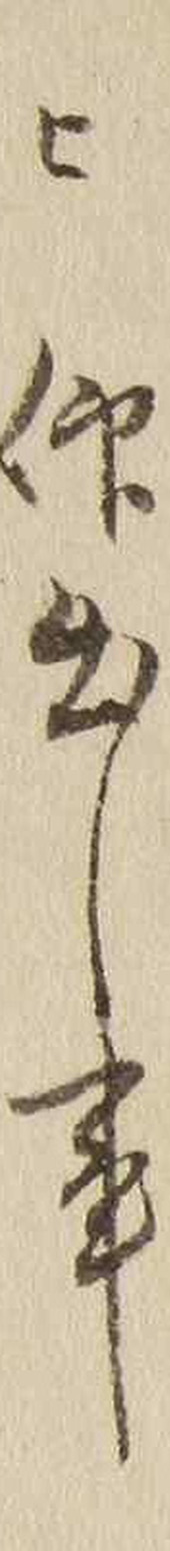被仰出候事
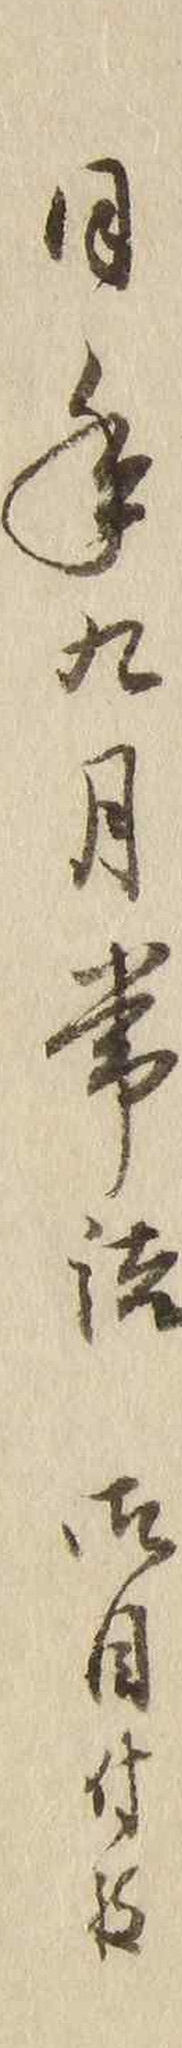一同年九月常詰御目付被

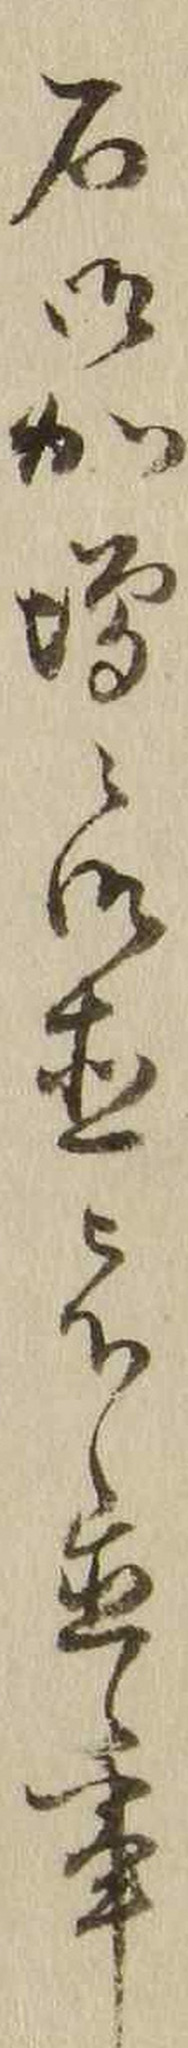石御加増ニ御直被下置候事
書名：諸士系譜　巻之225　ま之部6
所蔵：会津若松市立会津図書館
